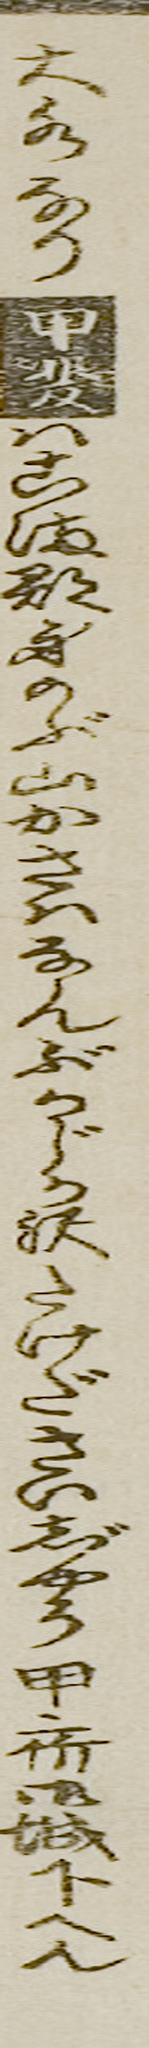大水なり甲斐はこま郡身のぶ山かさはなんぶかじか沢たけださいじやう甲府御城下へん
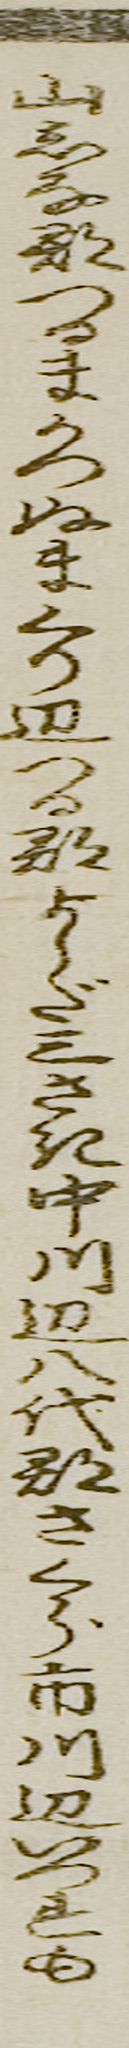山しな郡つるまかつぬまくり辺つる郡よしだ三さき中川辺八代郡さくら市川辺いつれも
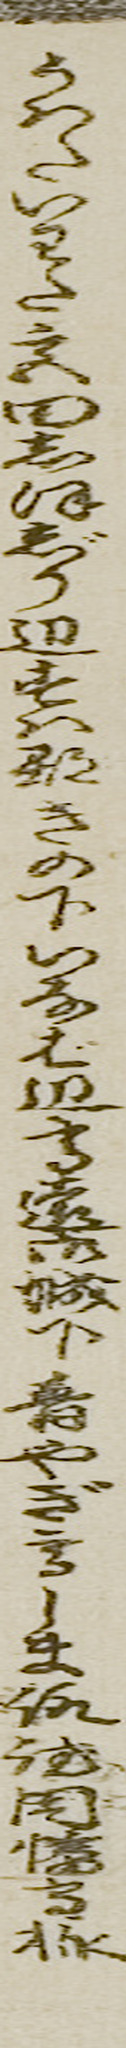うはたいわた宮田しほじり辺すは郡きの下いなば辺高遠御城下青やぎ高しま諏訪因幡守様
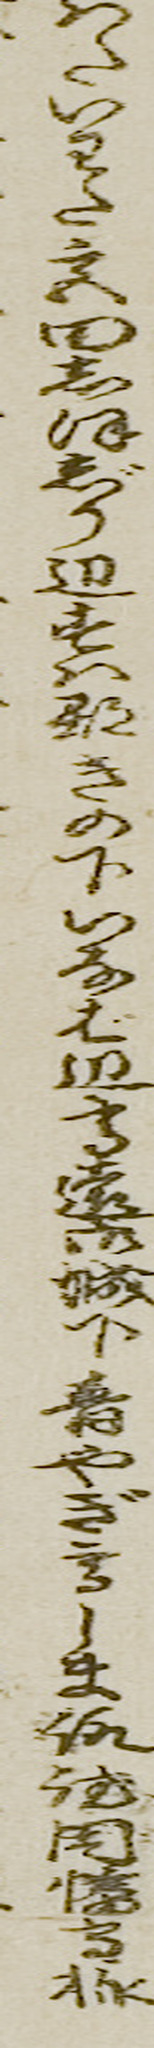うはたいわた宮田しほじり辺すは郡きの下いなば辺高遠御城下青やぎ高しま諏訪因幡守様
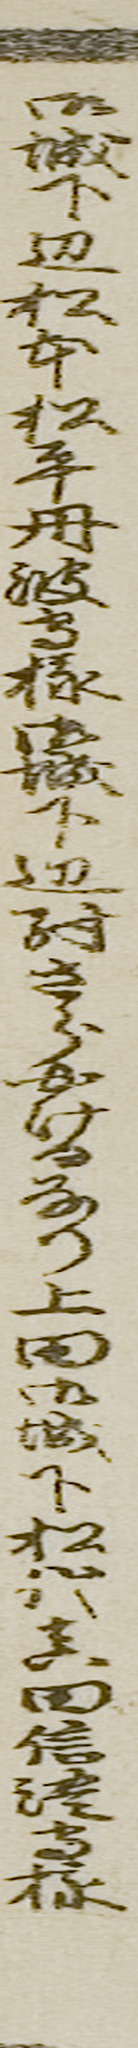御城下辺松本松平丹波守様御城下辺殊さらやけるなり上田御城下松代真田信濃守様
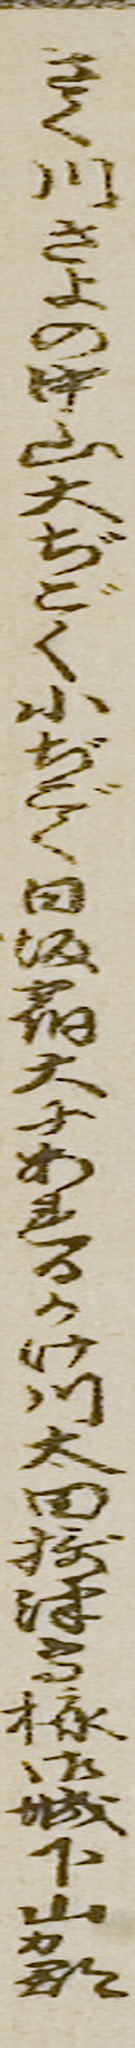きく川さよの中山大ぢごく小ぢごく日坂宿大にあれるかけ川太田摂津守様御城下山郡
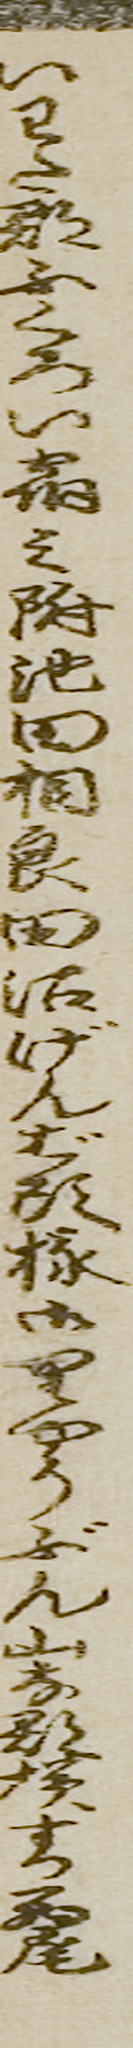いわた郡ふくろい宿ミ附池田相良田沼げんば頭様御りやうぶん山な郡横すすか西尾
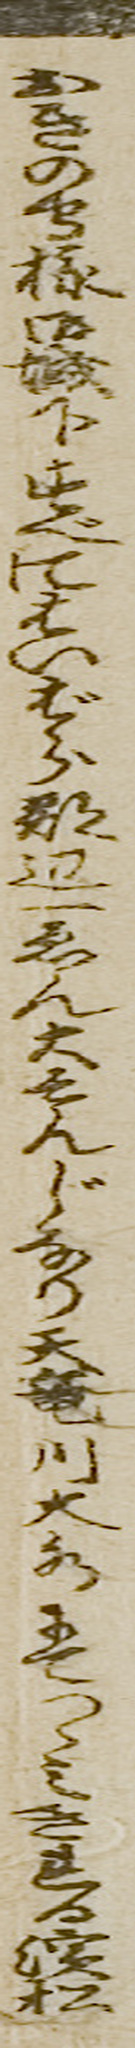おきの守様御城下すべてはいばら郡辺一ゑん大そんじなり天竜川大水にてつゝミきれる浜松
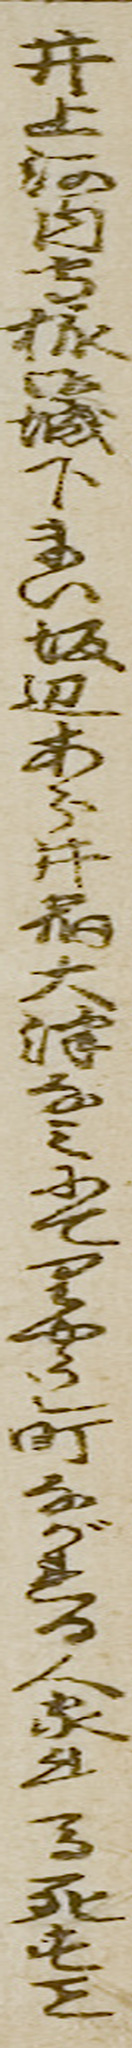井上河内守様御城下まい坂辺あら井宿大津なミにてりやうし町ながれる人家牛馬死すこと
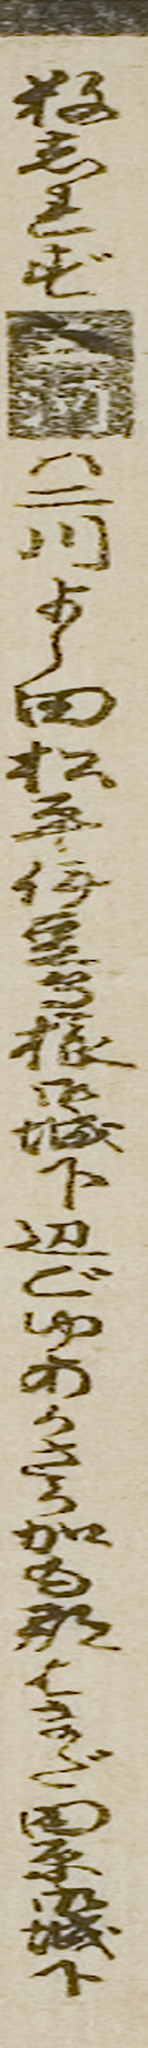数しれず三河ハ二川よし田松平伊豆守様御城下辺ごゆあかさかかも郡はまだ田原御城下
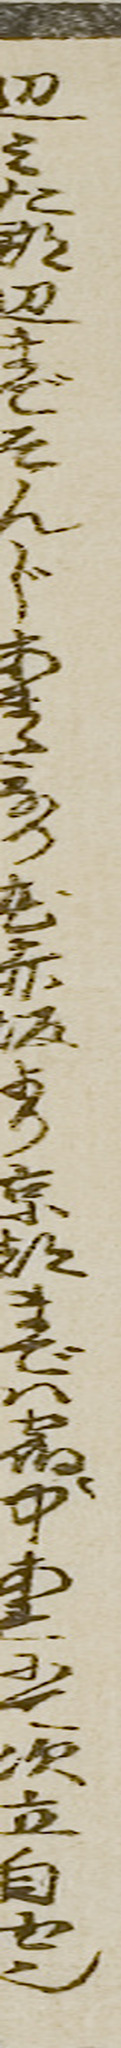辺ミた郡辺までそんじあまたなり尤赤坂より京都までハ宿中あれにて次立自由也
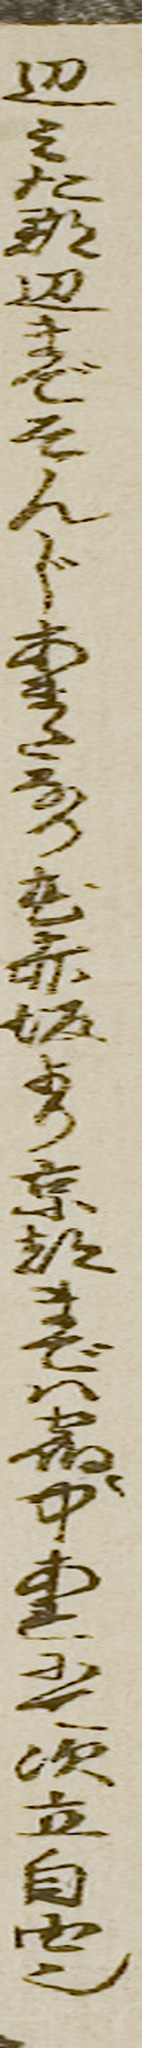辺ミた郡辺までそんじあまたなり尤赤坂より京都までハ宿中あれにて次立自由也
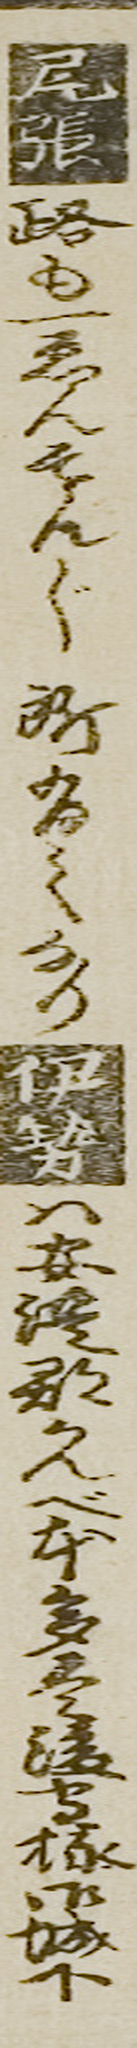尾張路も一ゑんそんじ所有之なり伊勢ハ安濃郡かんべ本多豊後守様御城下
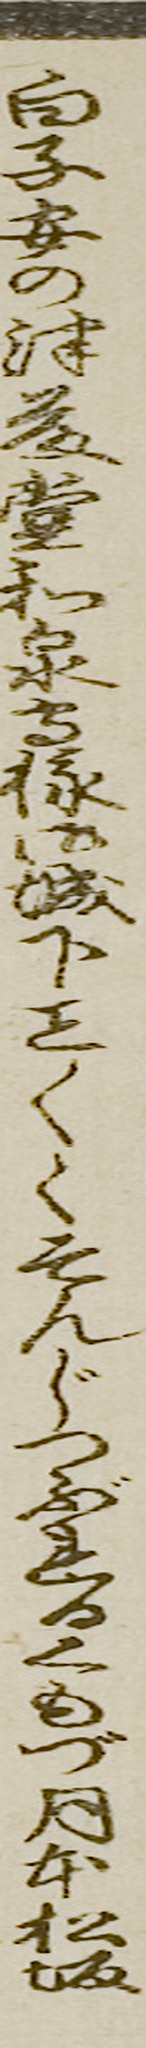白子安の津藤堂和泉守様御城下こと〳〵くそんじつぶれるくもづ月本松坂
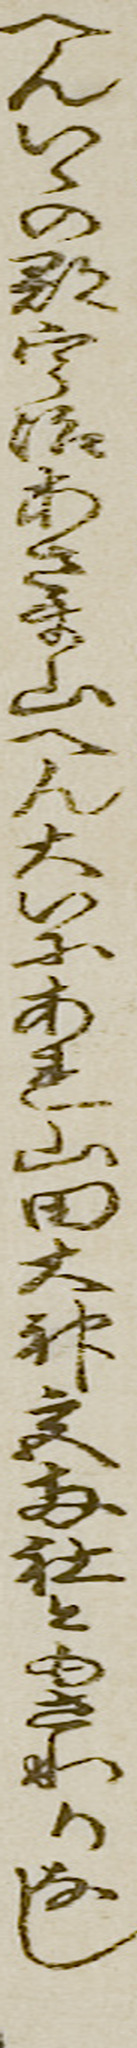へんいゝの郡宇治あさま山へん大いにあれ山田大神宮両社ともさわりなし
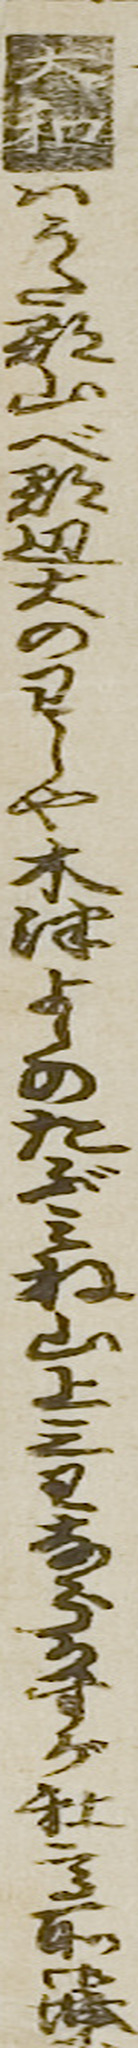大和ハうた郡山べ郡辺大のわしや木津よしのたぶミね山みわならかすが社高取御城下
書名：諸国大地震之図
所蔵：東京大学総合図書館 General Library in the University of Tokyo, JAPAN
